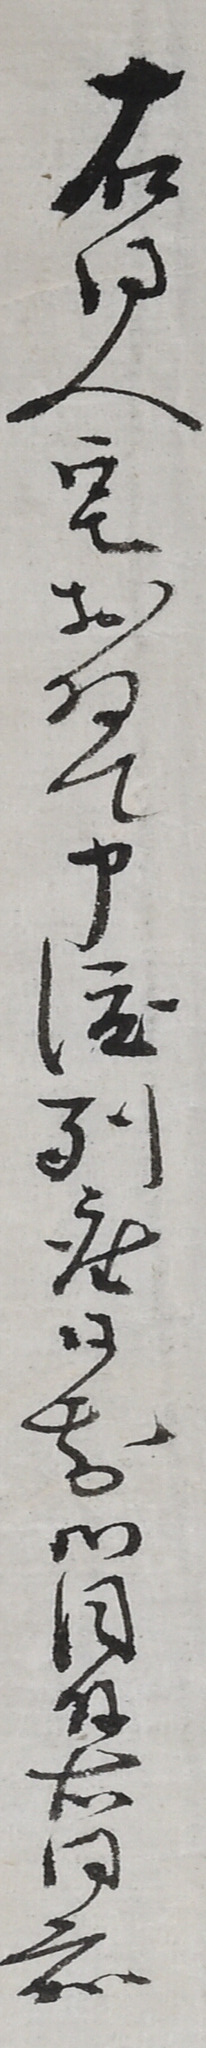右同人宅おゐて申渡列座同前御目付右同前
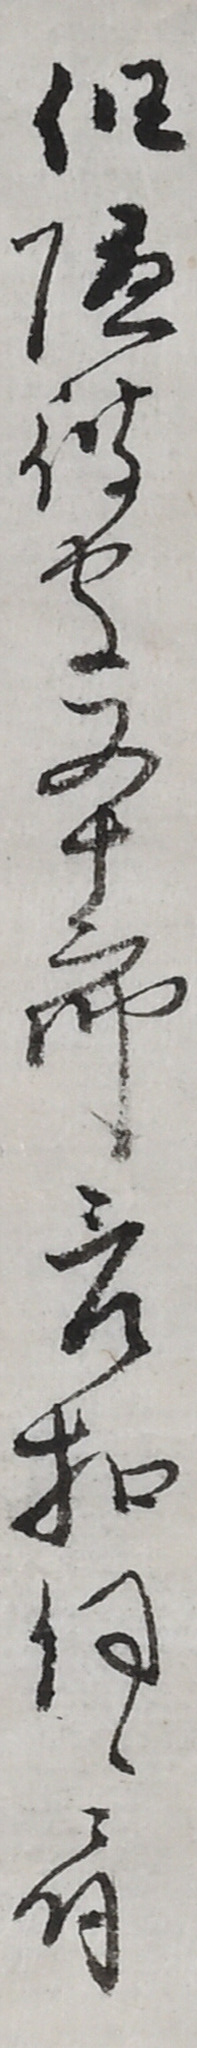但隠岐守又十郎差控伺候ニ付
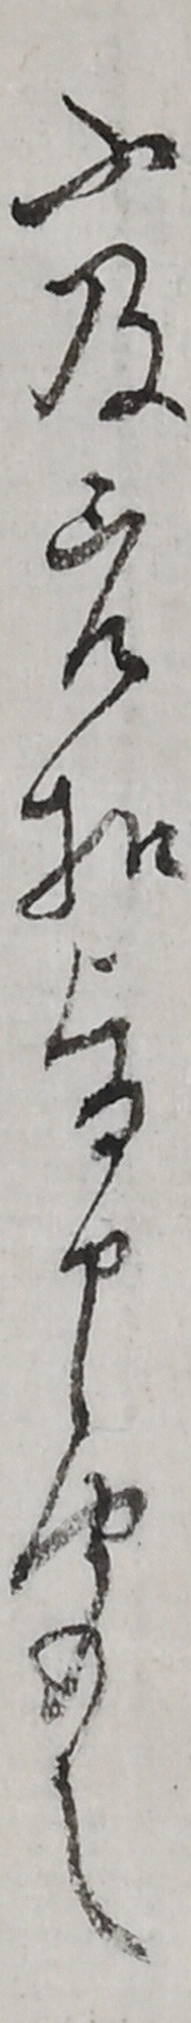不及差控旨申聞候
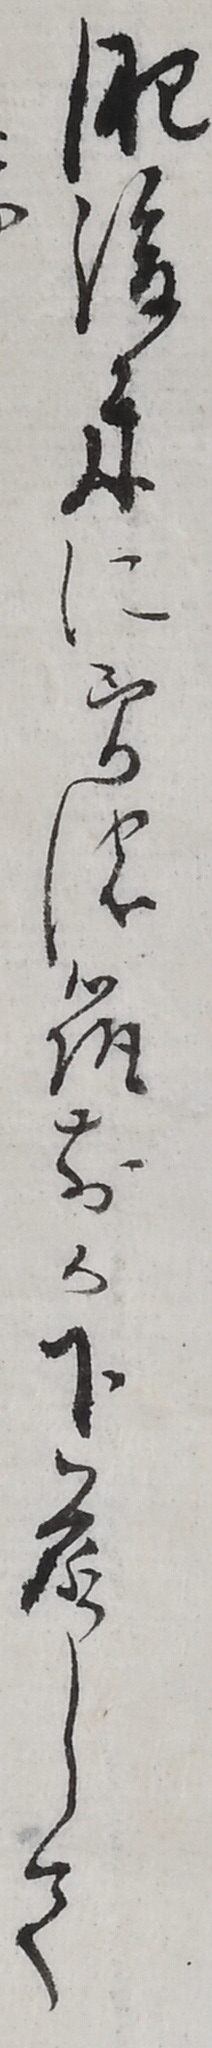肥後米に美濃筑前か下落して
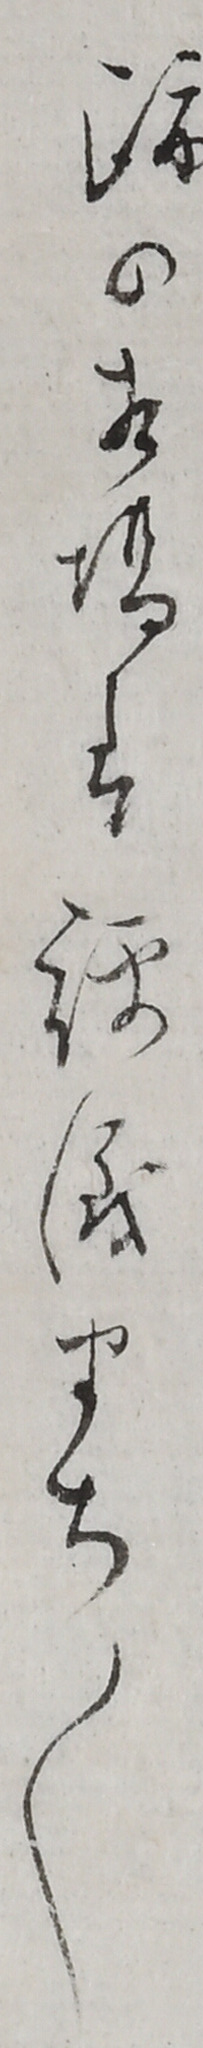跡の相場は評儀まち〳〵
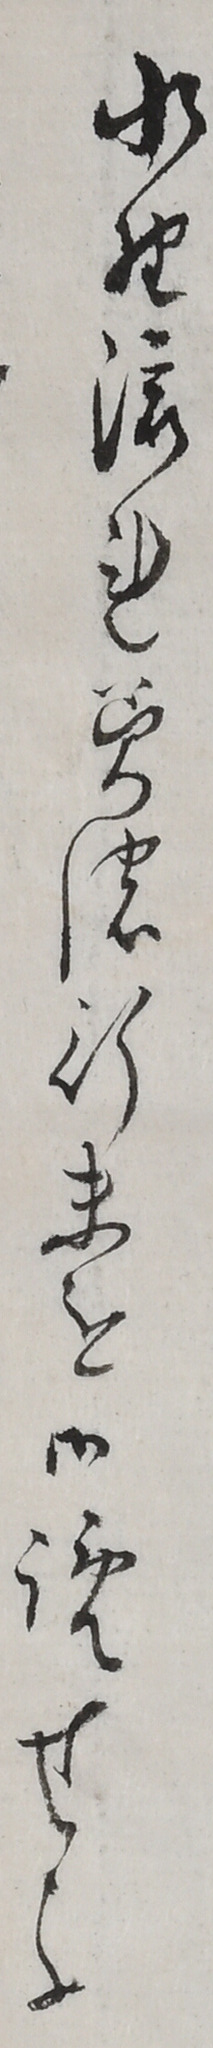水野流れ美濃行末を御覧せよ
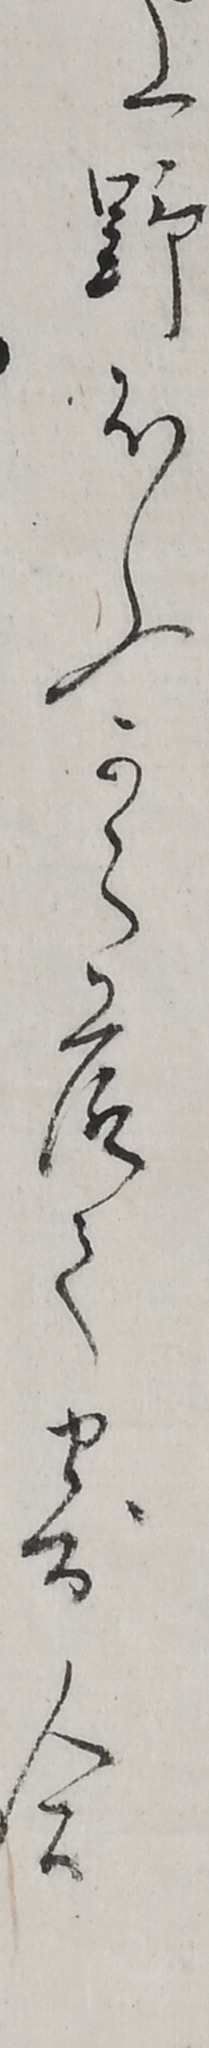上野ほふから落て寄合
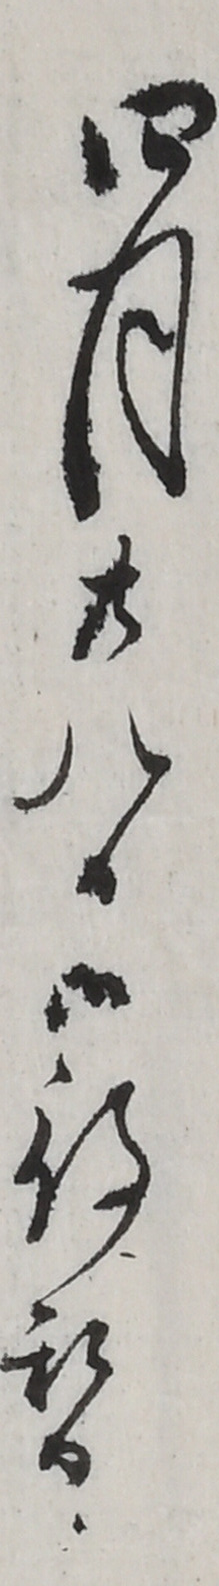四月廿八日御役替

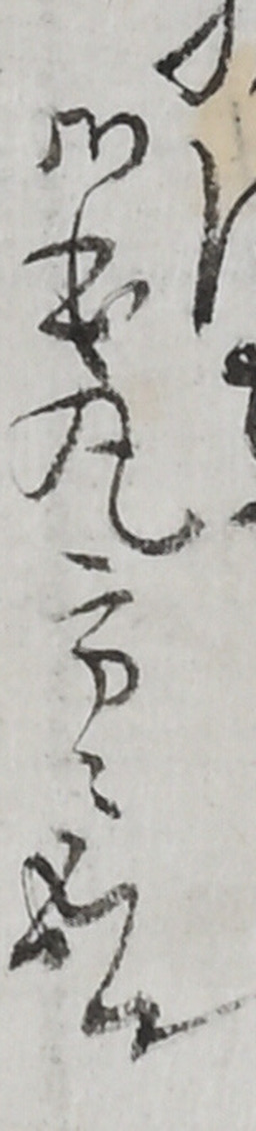御本丸方ニ成ル
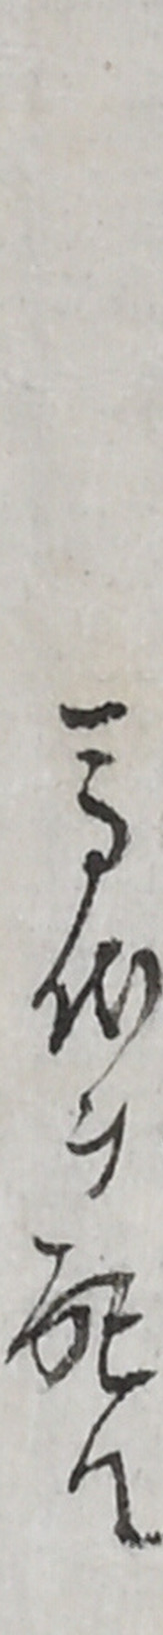馬他ヲ配ル
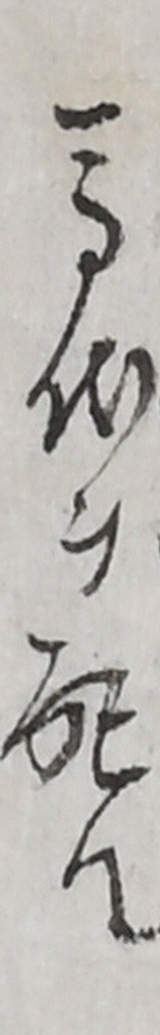馬他ヲ配ル
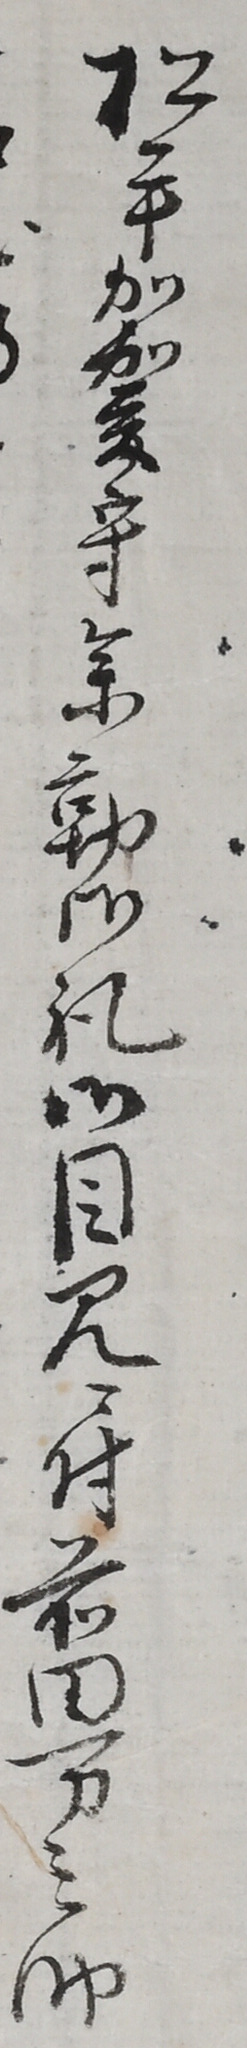松平加賀守参勤御礼御目見ニ付前田万之助
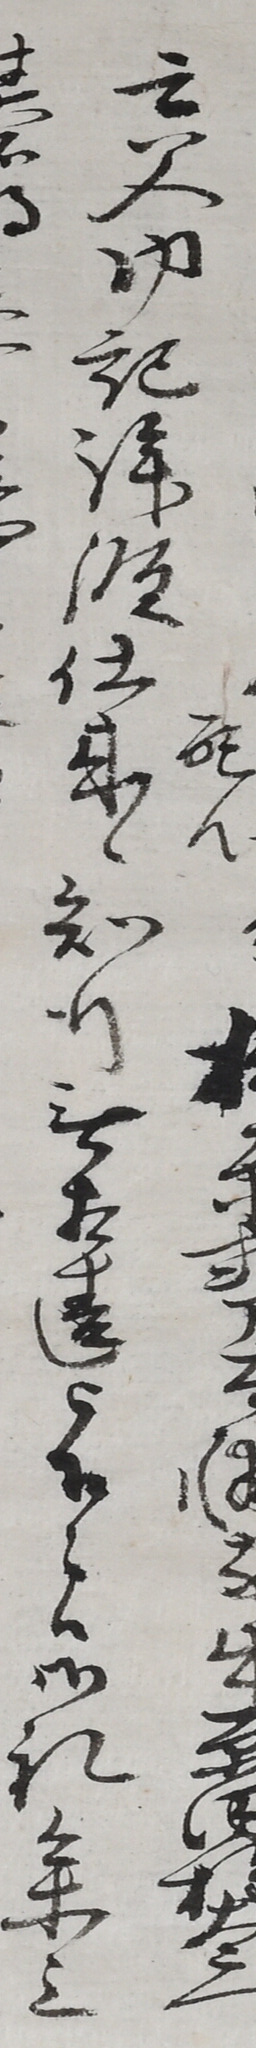亡父内記事拝領仕来候地行無相違被下候間御礼参上
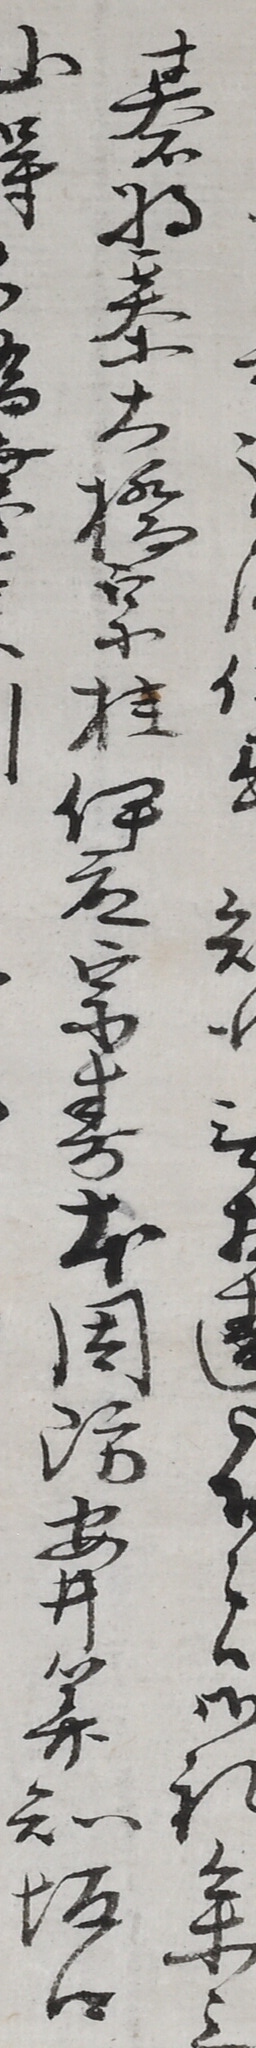碁将棋大橋宗桂伊藤宗寿本因防安井算知坂口
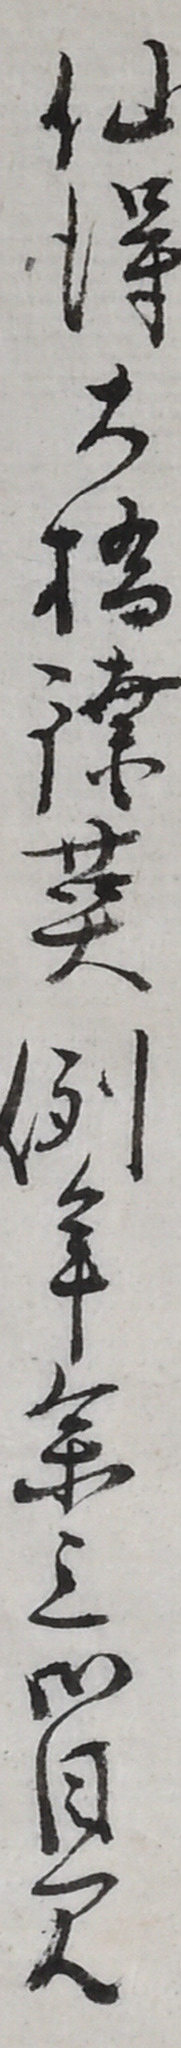仙得大橋鐐英例年参上御目見
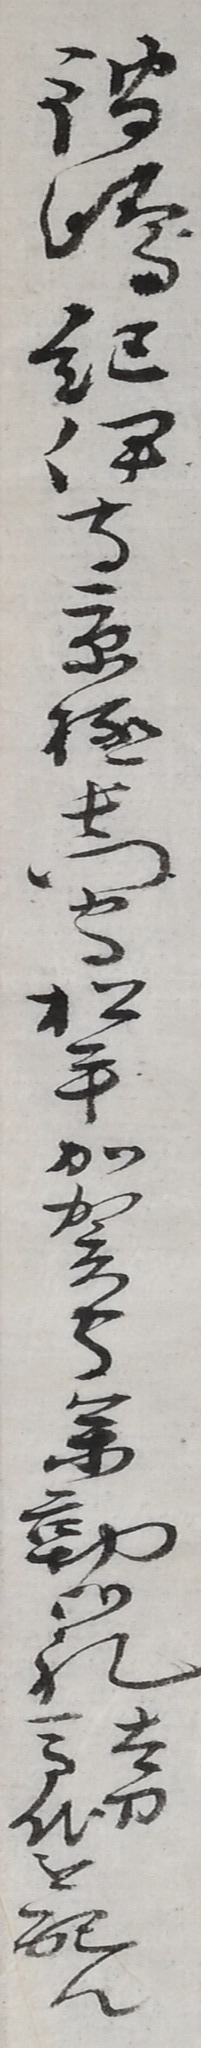鍋嶋紀伊守京極長門守松平加賀守参勤御礼太刀馬代を配ル
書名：申渡候書付
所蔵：伊那市立高遠町図書館・合同会社AMANE
